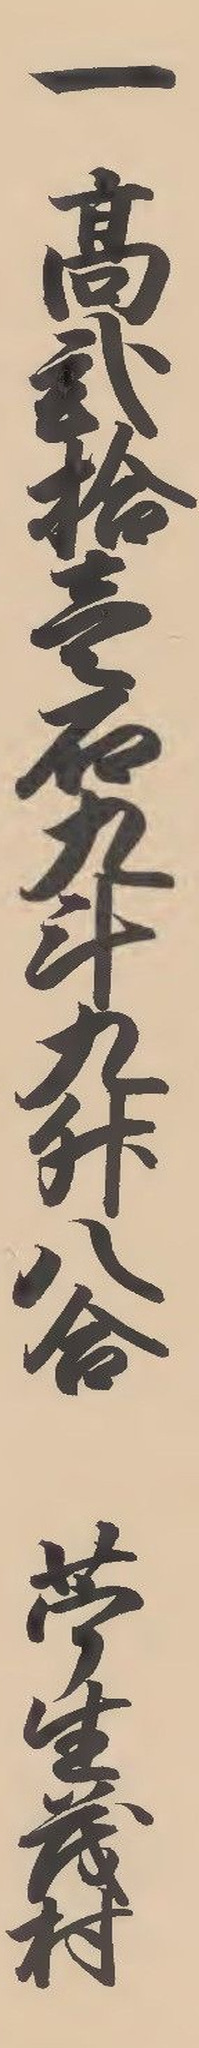一高弐拾壱石九斗九升八合苧生茂村
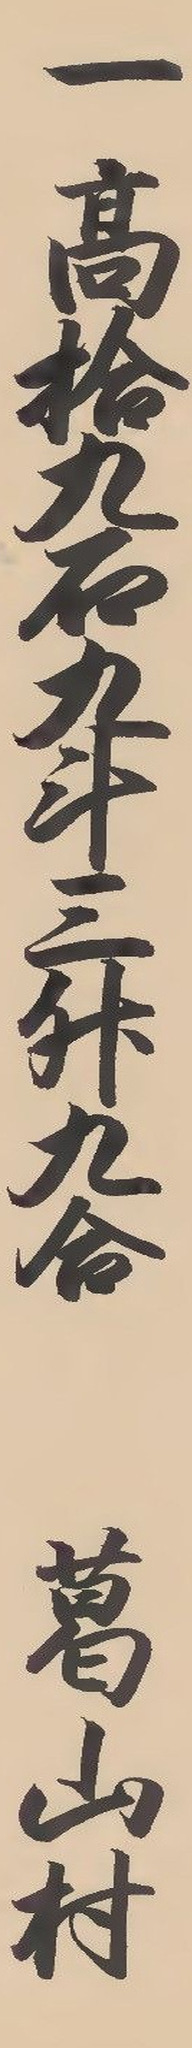一高拾九石九斗三升九合葛山村
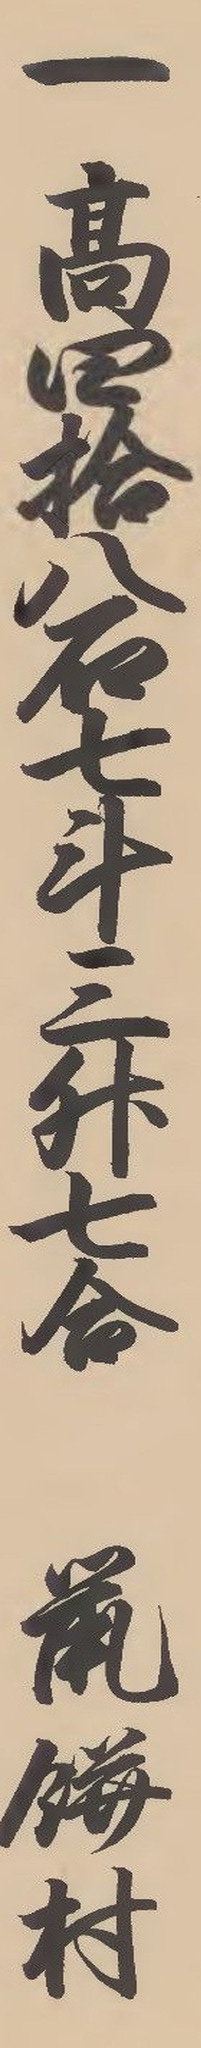一高四拾八石七斗三升七合鼠餅村
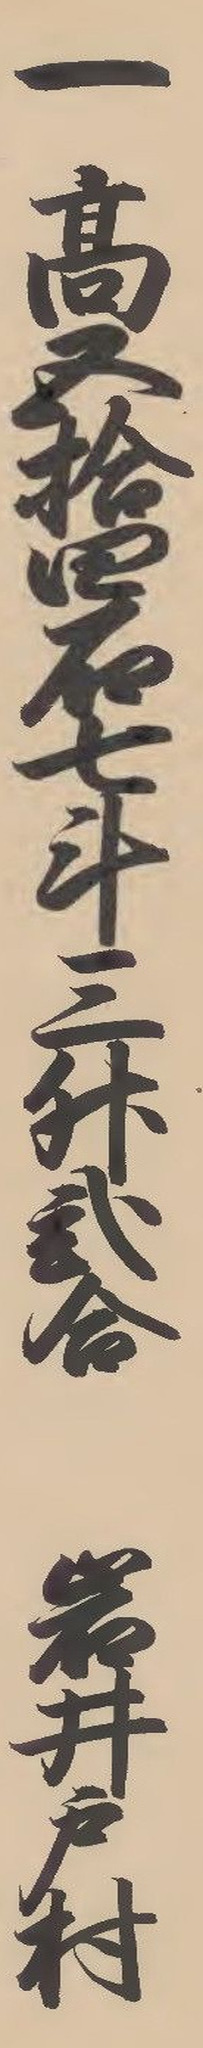一高五拾四石七斗三升弐合岩井戸村
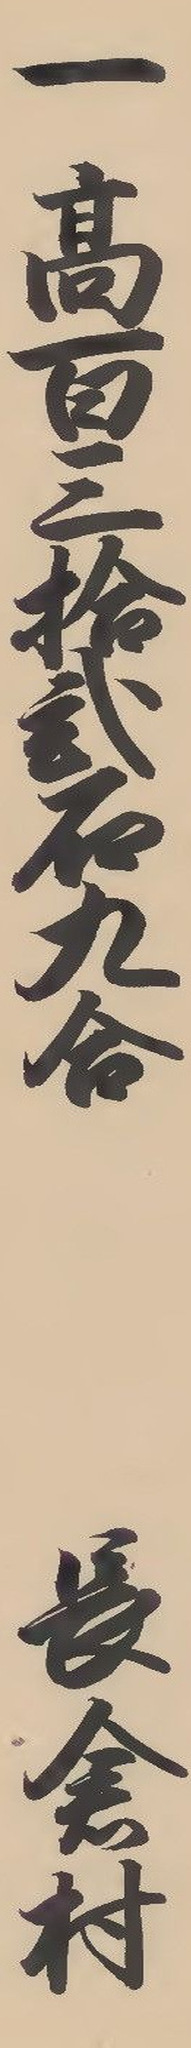一高百三拾弐石九合長倉村

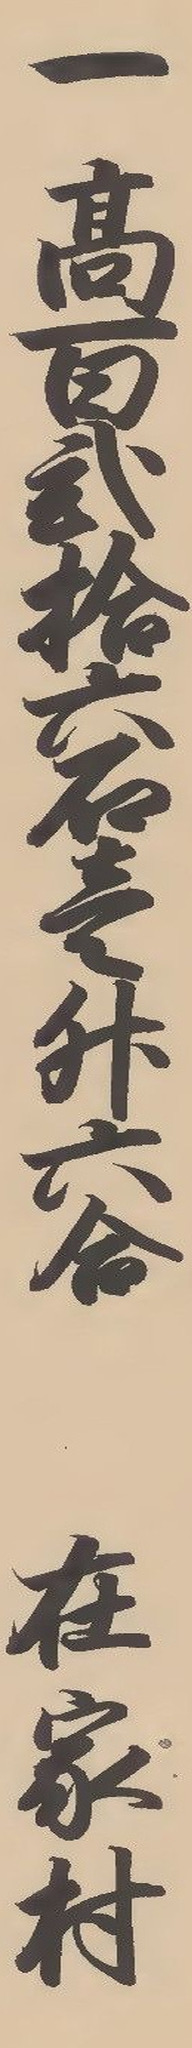一高百弐拾六石壱升六合在家村
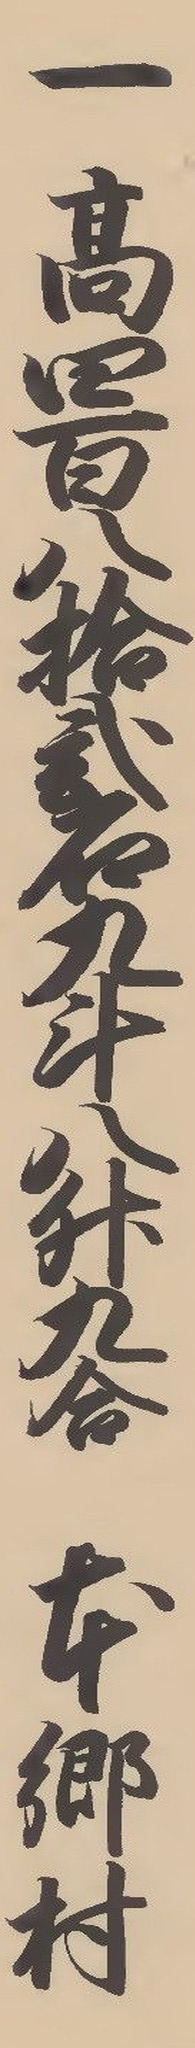一高四百八拾弐石九斗八升九合本郷村
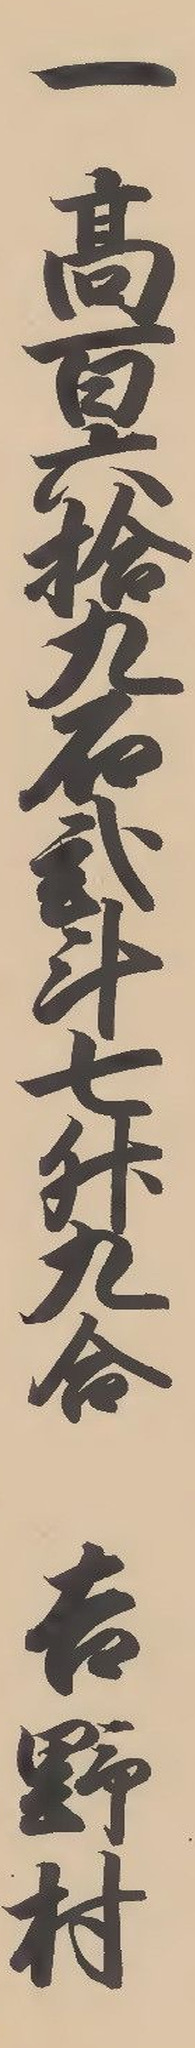一高百六拾九石弐斗七升九合吉野村
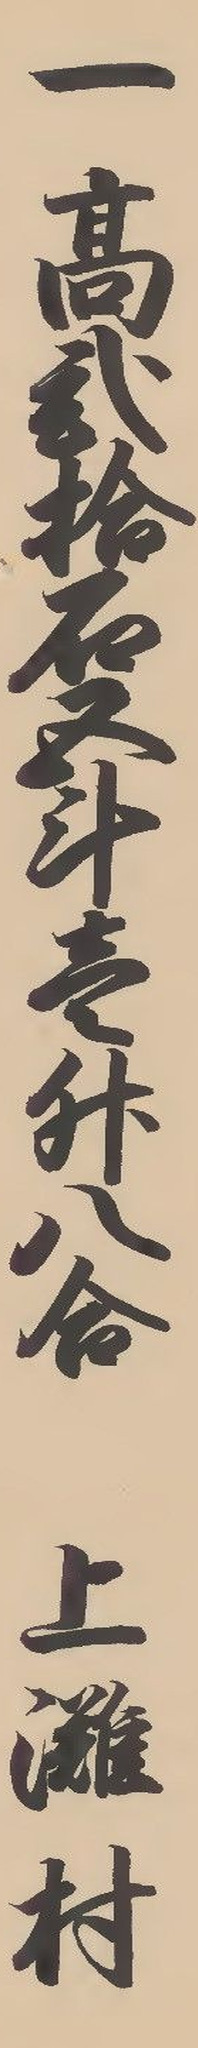一高弐拾石五斗壱升八合上灘村
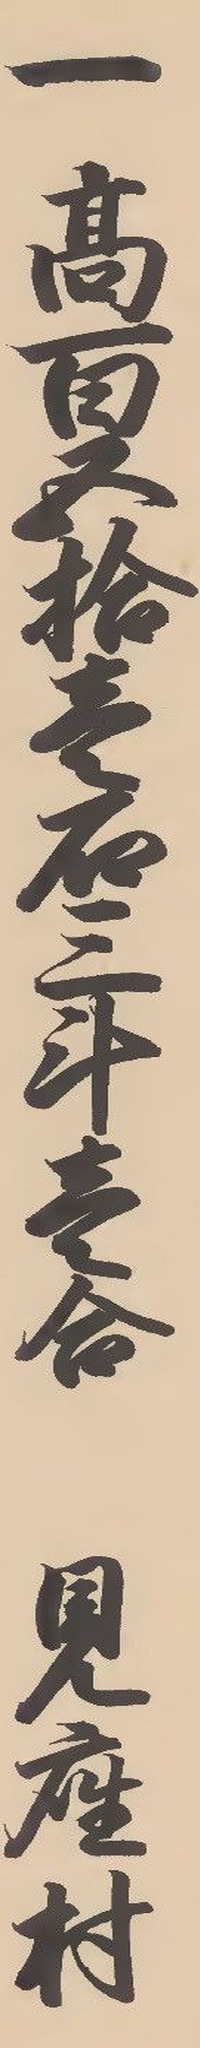一高百五拾壱石三斗壱合見座村
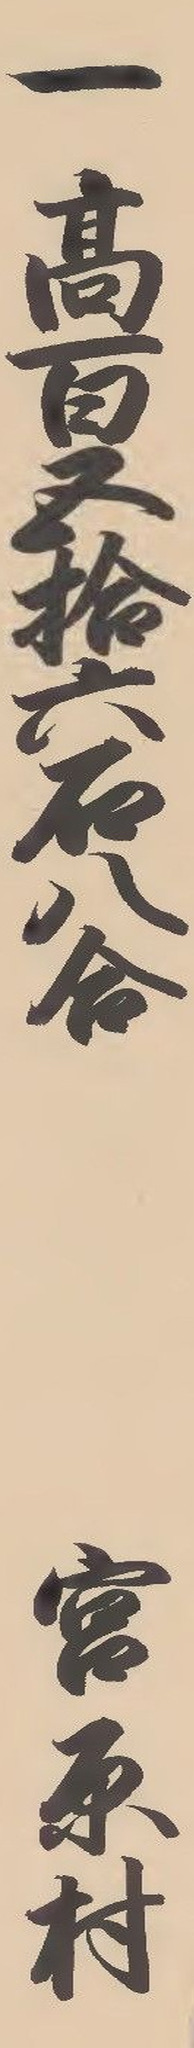一高百五拾六石八合宮原村
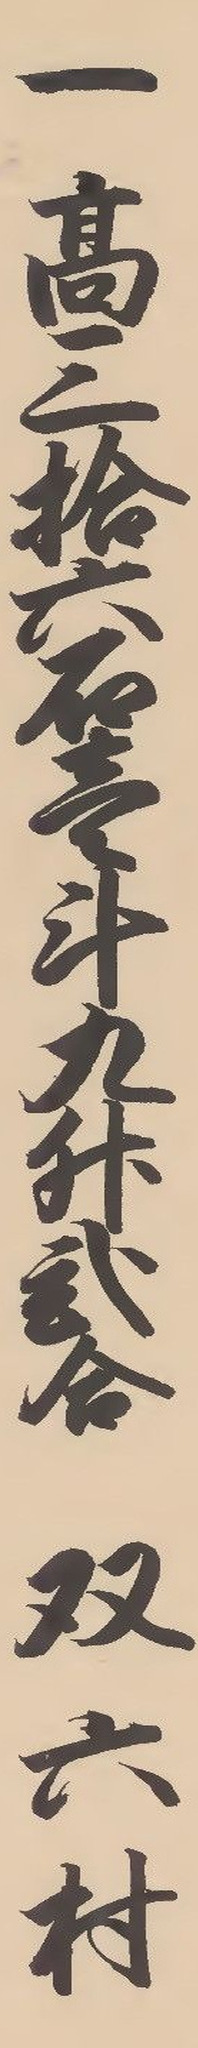一高三拾六石壱斗九升弐合双六村
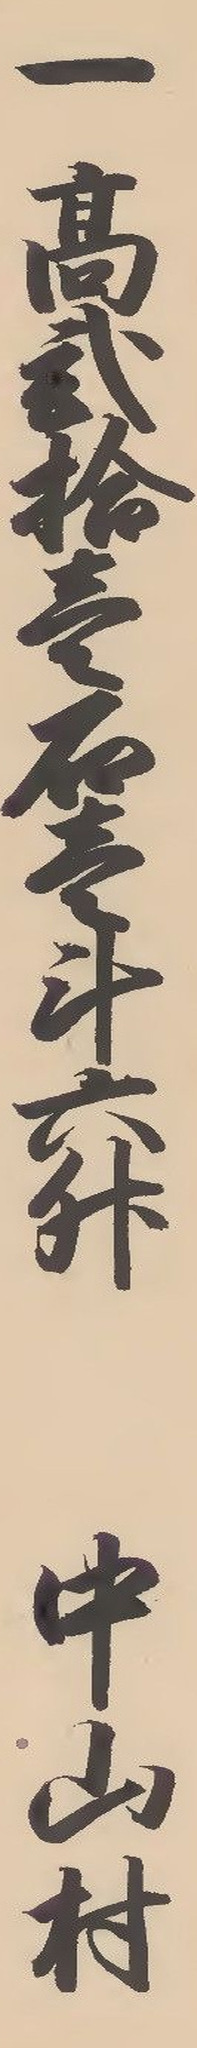一高弐拾壱石壱斗六升中山村

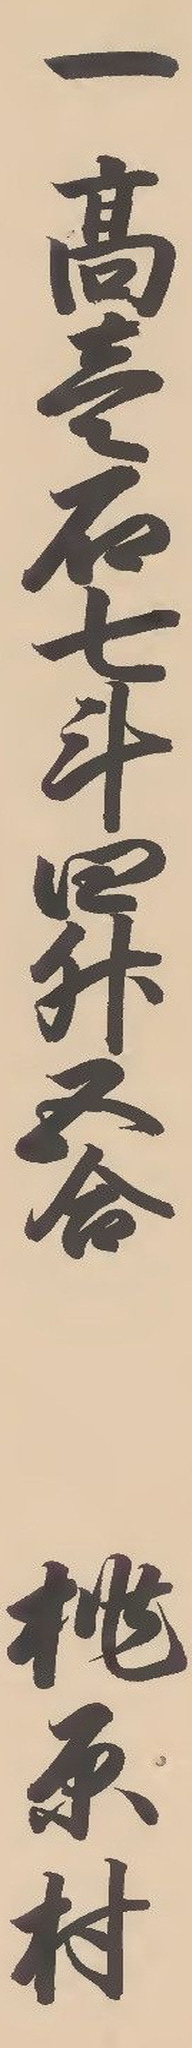一高壱石七斗四升五合桃原村
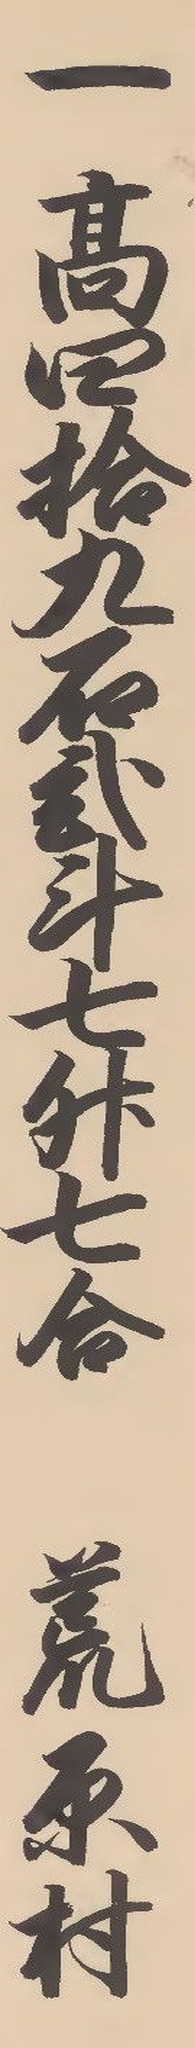一高四拾九石弐斗七升七合荒原村
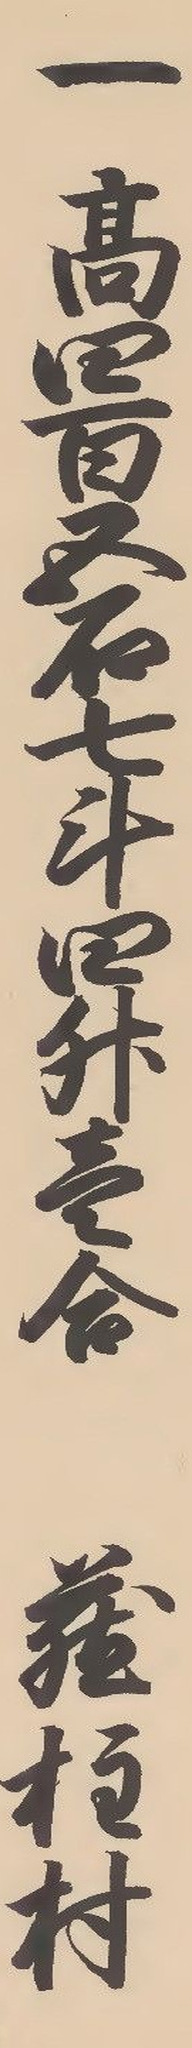一高四百五石七斗四升壱合蔵柱村
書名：飛騨国郷帳
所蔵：国立公文書館 National Archives of Japan
